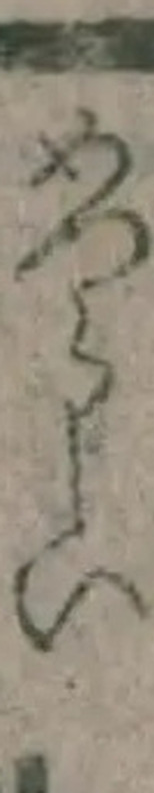めつらしい
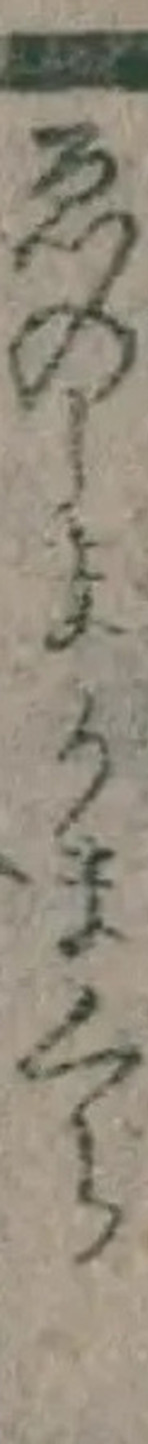えのしまかまくら
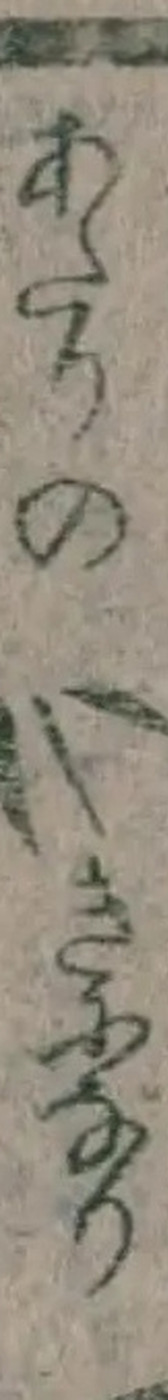あたりのきになり
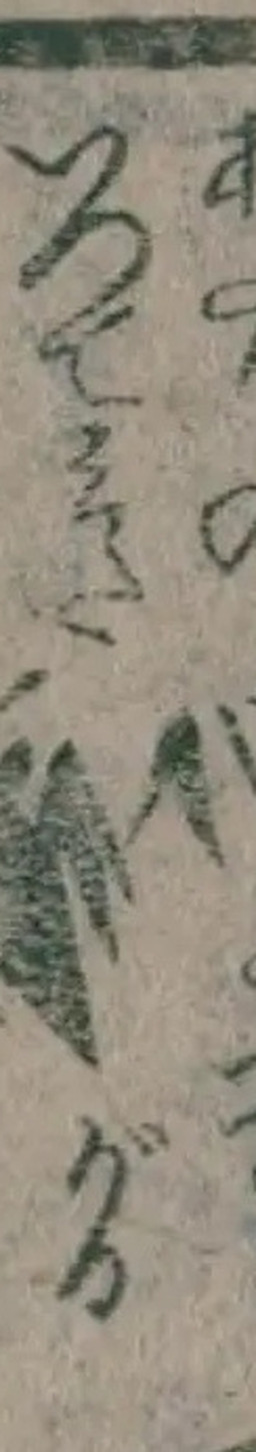いつてみたがる
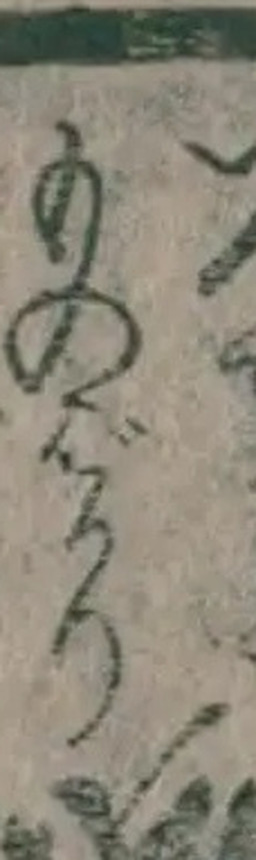ものばかりなか
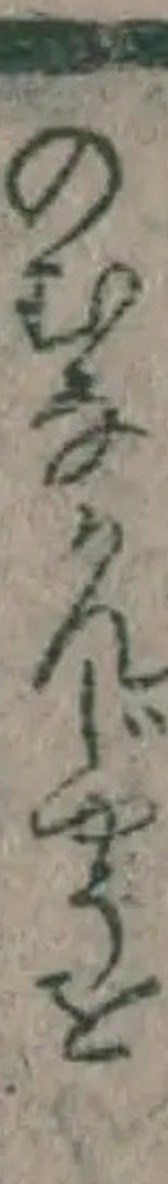のむなかんじやうを
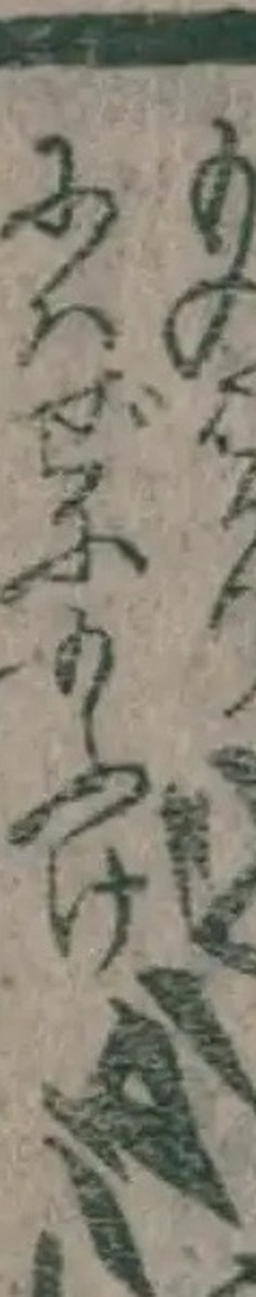にはぜにもふけ
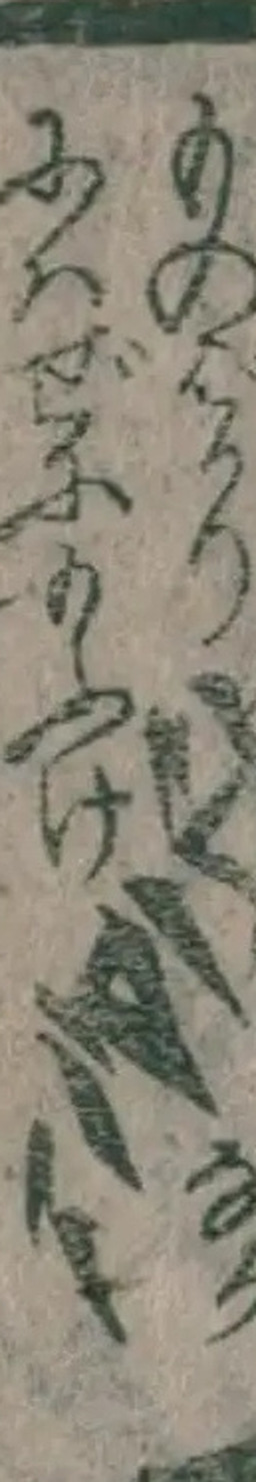にはぜにもふけ
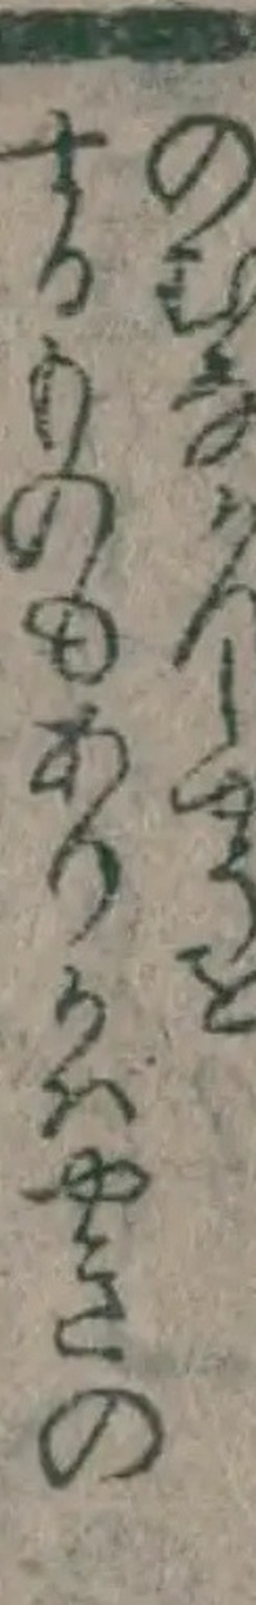するものもありかばやきの
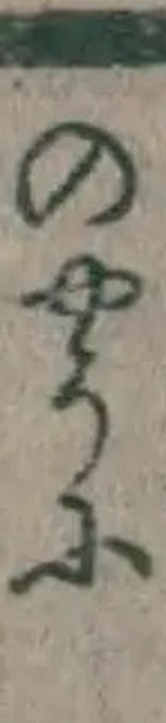のやうに
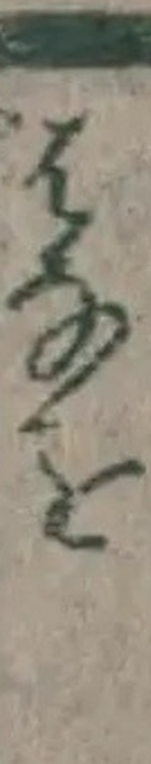はなを
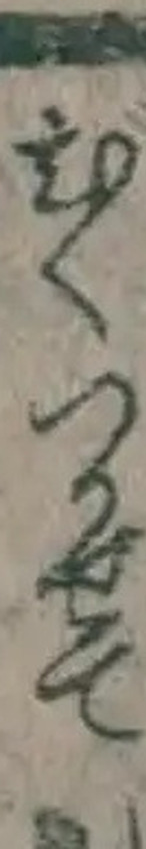ひくつかせて
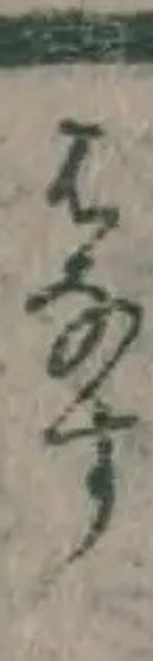はなす
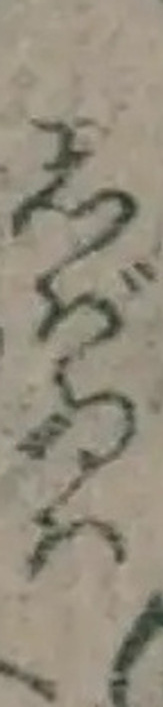しばゐは
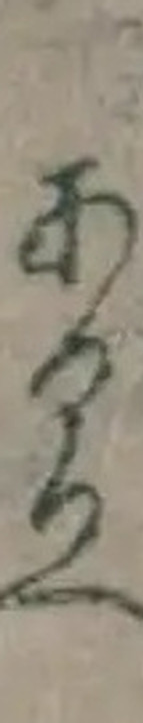あるかへ

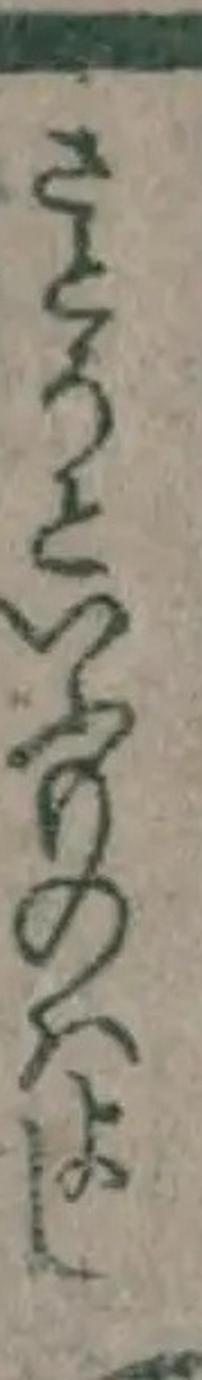さとうといふものはよし
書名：縦筒放唐の噺 3巻
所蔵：国立国会図書館 National Diet Library, JAPAN
